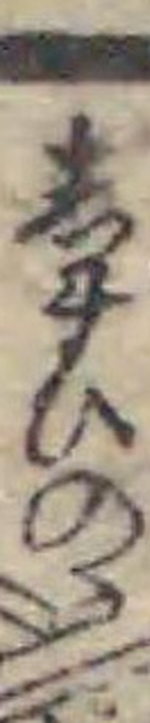しまひの
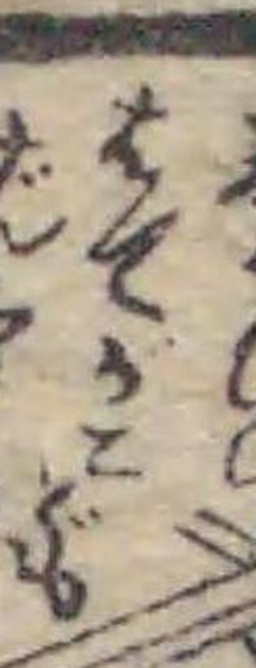はてがこども
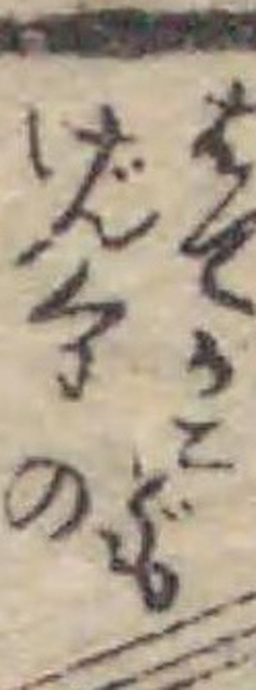げんくわの
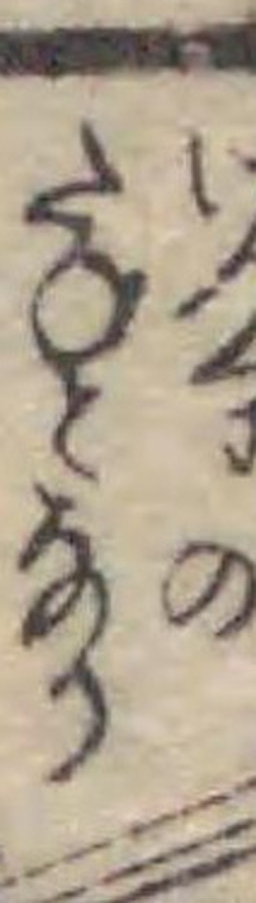たねとなり
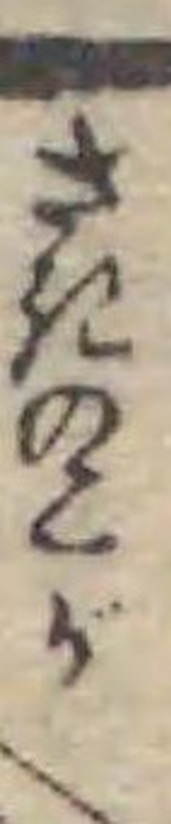さきのこが
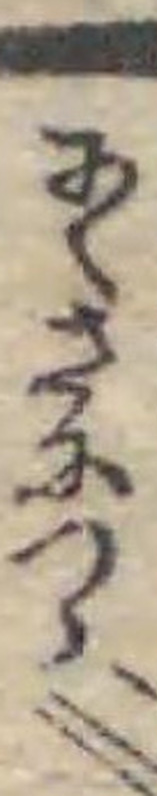にくさにつら
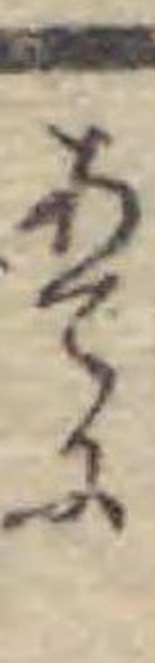あてに
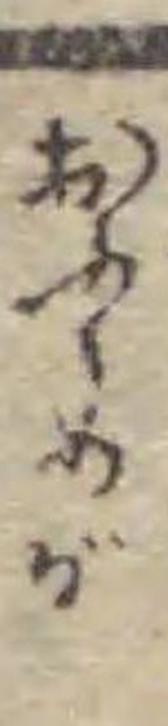おふくめが
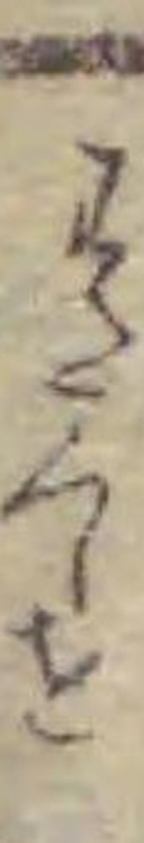わたくしを
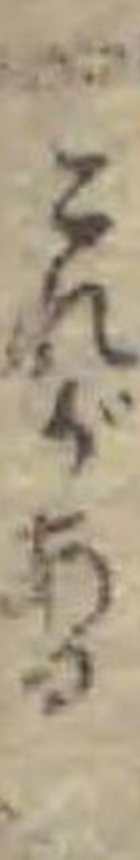これがある
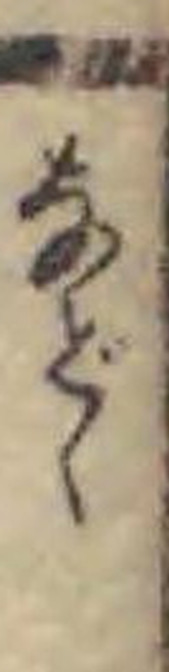などゝ
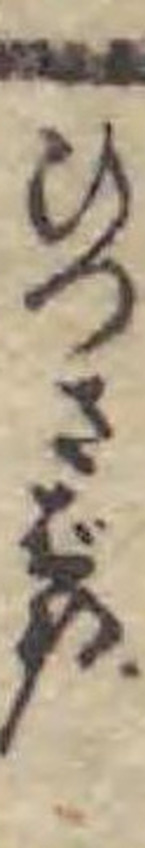ひつさばき
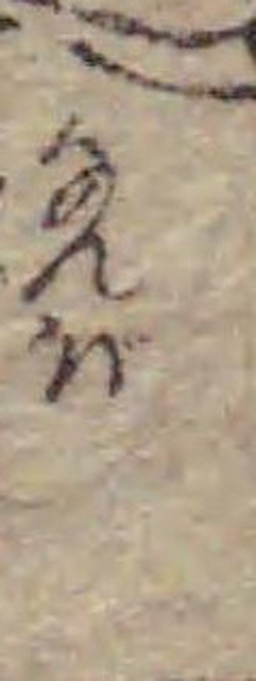なんぼ
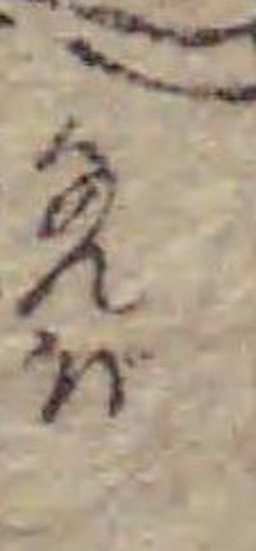なんぼ
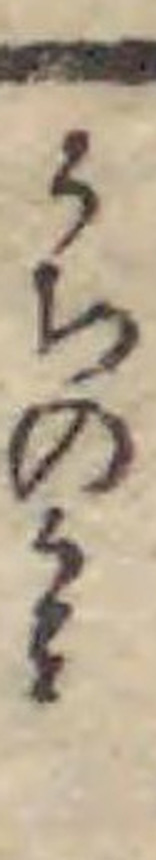うちのかみ
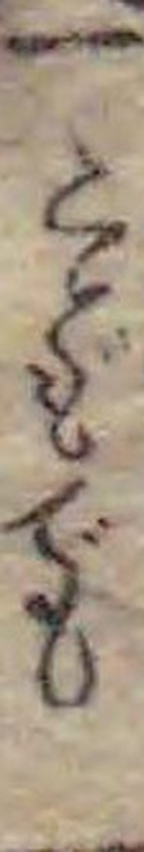こどもでも
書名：紙屑身上噺 : 3巻
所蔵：国立国会図書館 National Diet Library, JAPAN
